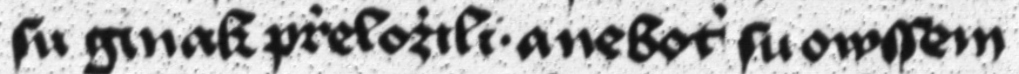ſu ginak pṙelożili. a neboṫ ſu owſſem
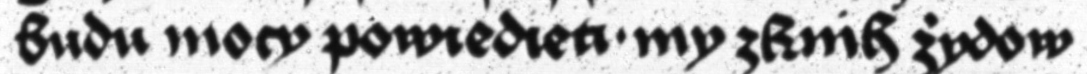budu mocy powiedieti. my zknih żydow
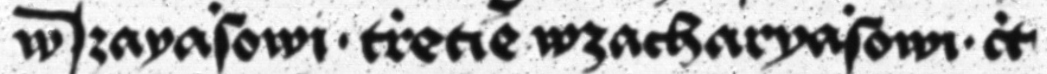w Izayaẛowi. tṙetíe wzacharyaṙowi. čt
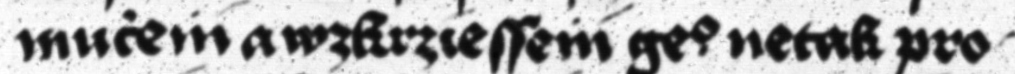muċení a wzkrzieſſeṅí ge° netak pro
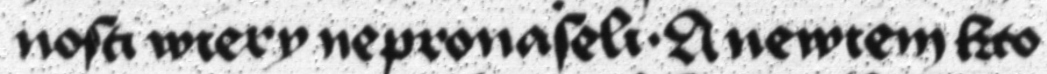noſti wíery nepronaẛeli. A newtem kto
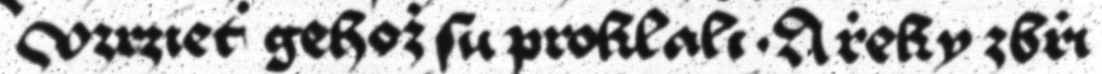Vzrzíeṫ gehoż ſu proklali. A ṙeky zbṙi
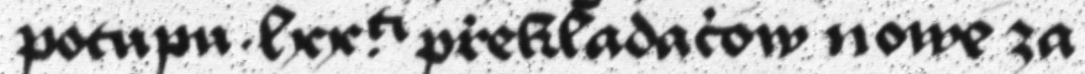potupu. lxxti pṙekladaċow nowe za
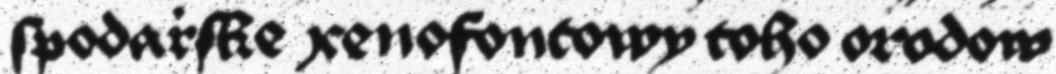ſpodaṙſke xenofontowý toho orodow
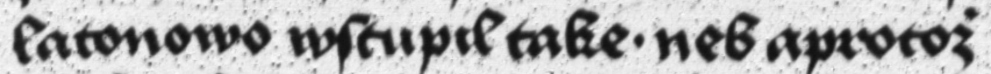latonowo wſtupil take. neb a protoż
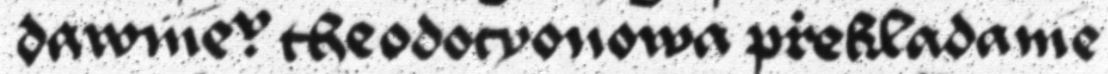dawṅíev the odocyonowa pṙekladaníe
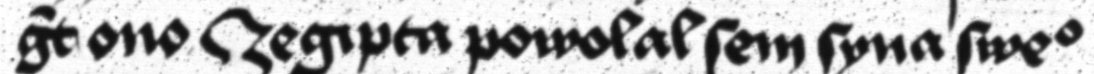ḡt ono Zegipta powolal ſem ſyna ſwe°
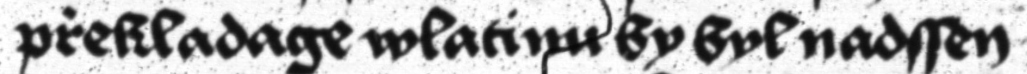pṙekladage wlatinu by byl nadſſen
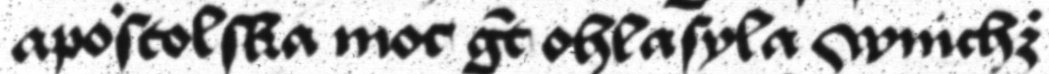apoẛtolska moc ḡt ohlaſyla Wnichż
